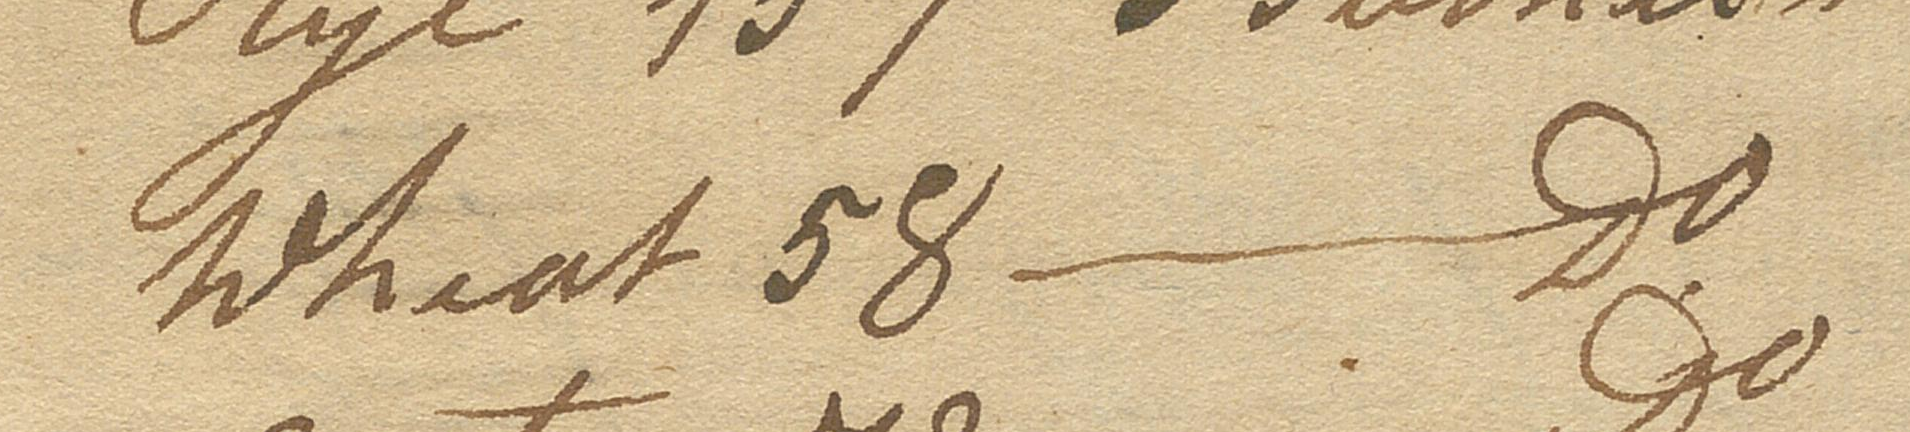Wheat 58- D^o
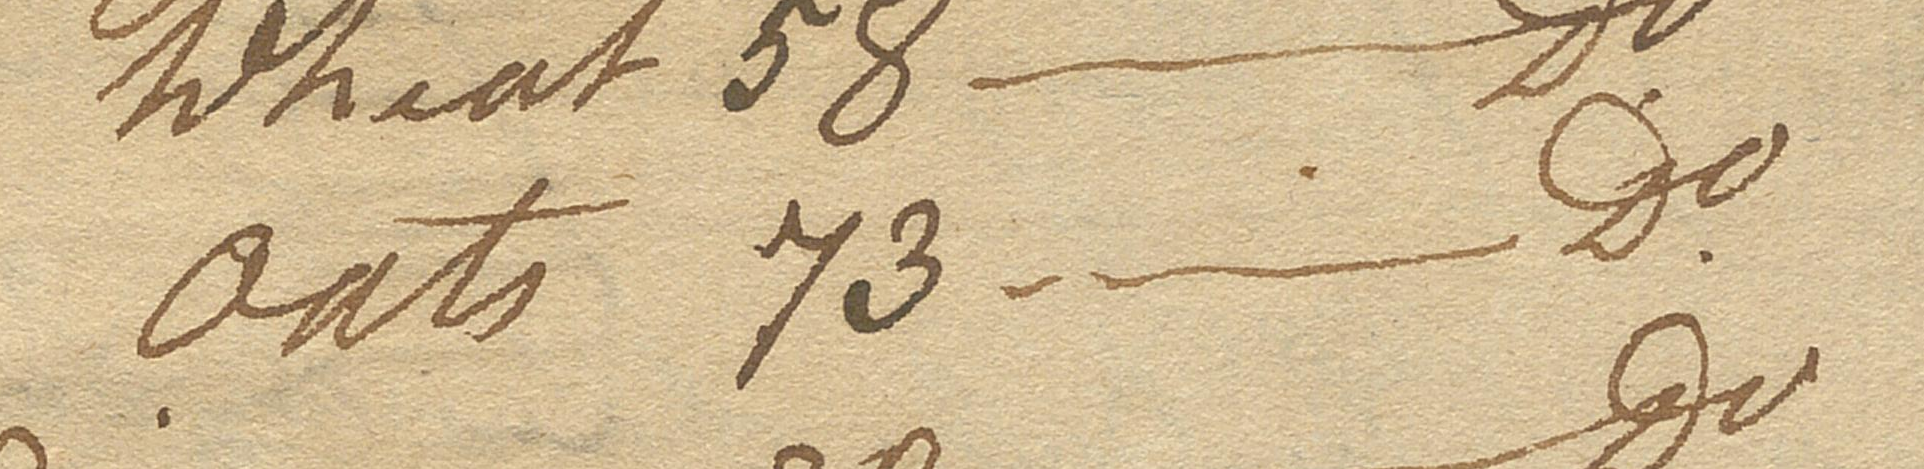Oxts 73- D^o
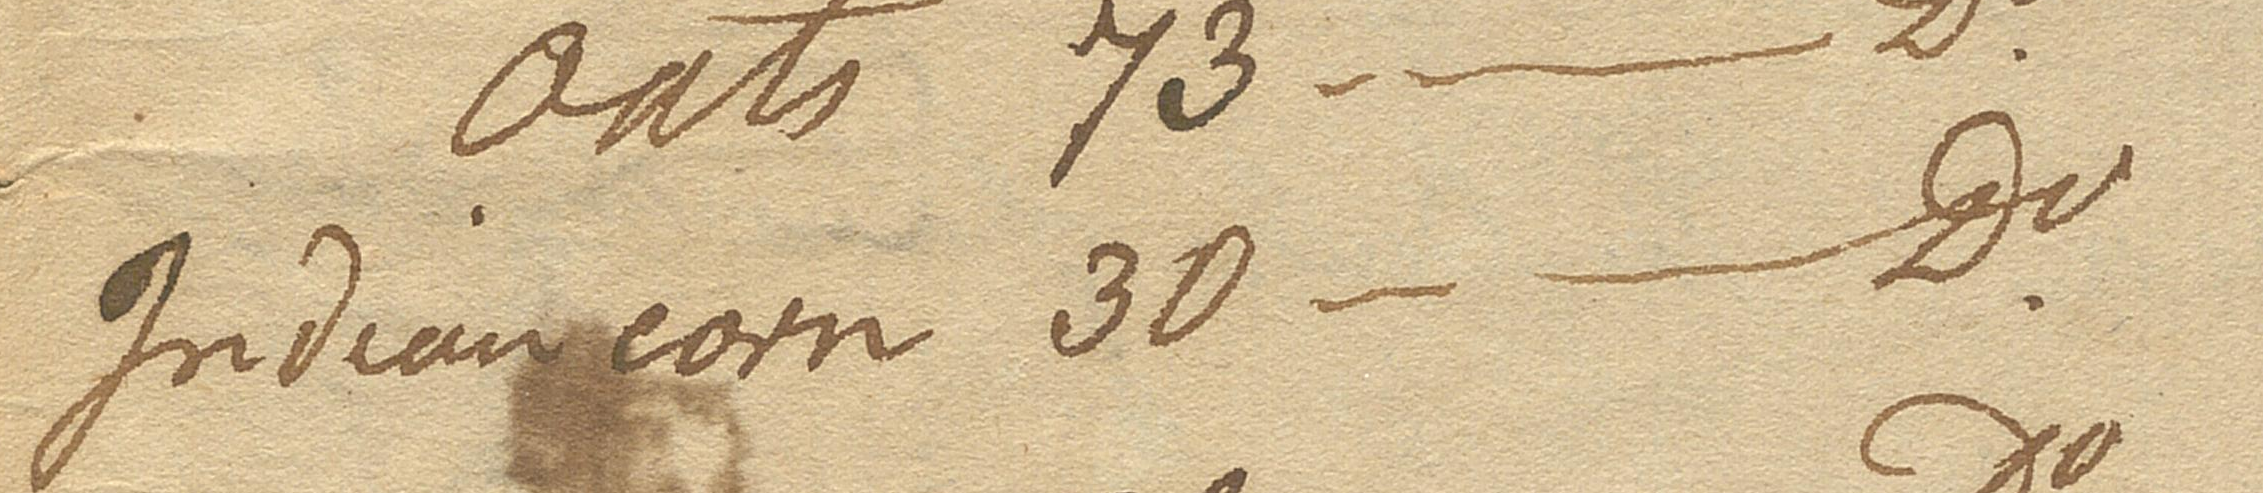Indian corn 30- Dor
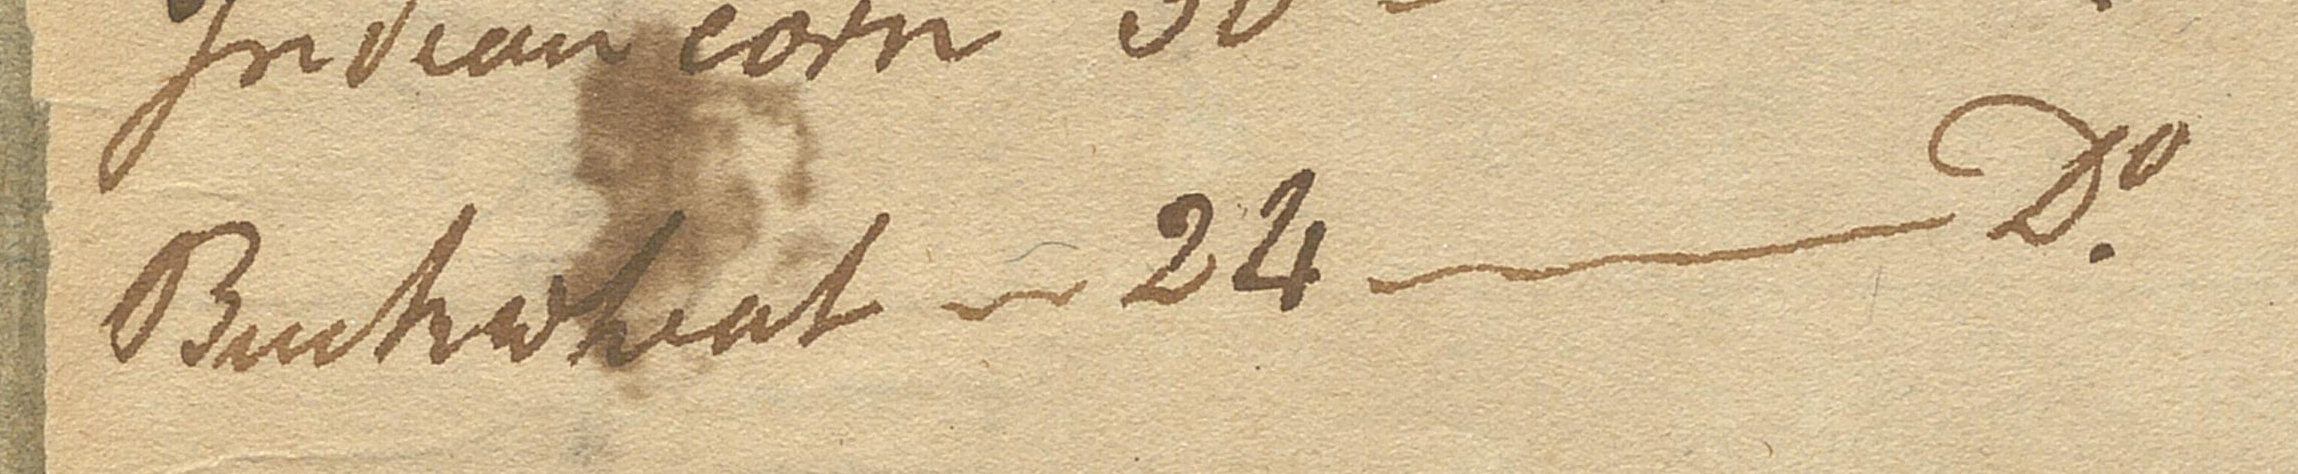Buckwheat- 24- D^o.
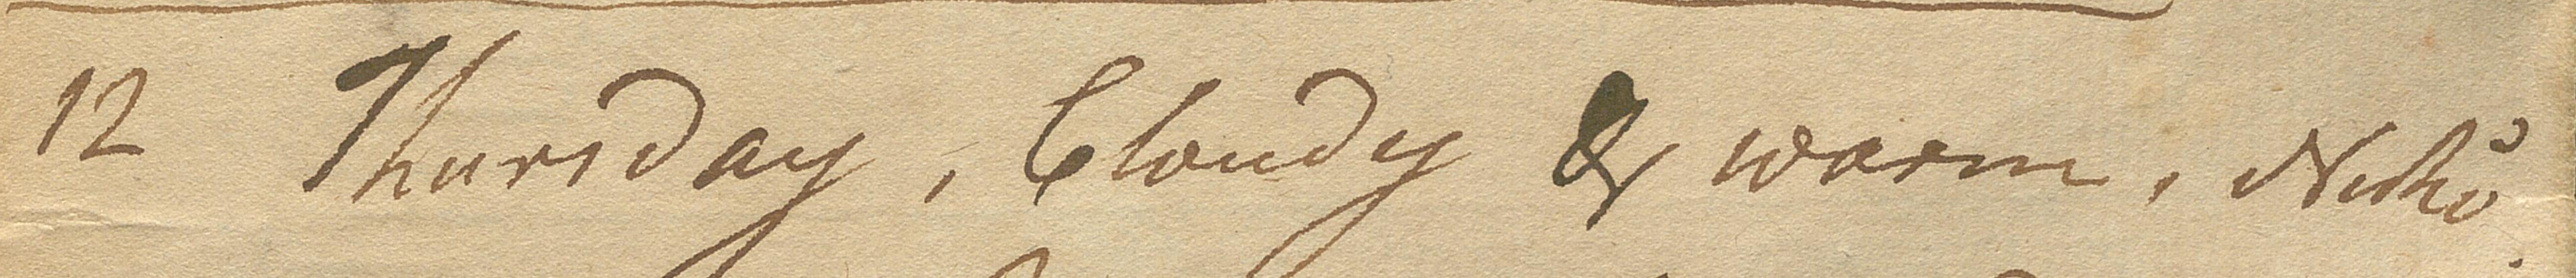12 Thursday, Cloudy & warm, Nicho^s
